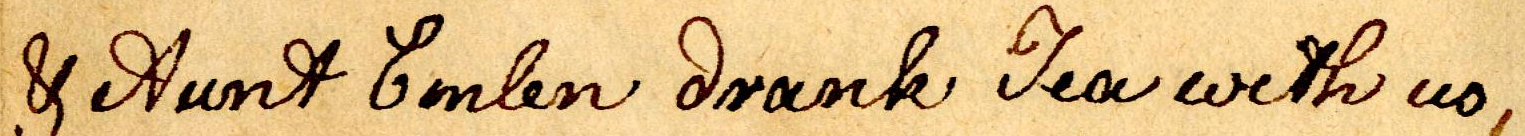& Aunt Emlen drank Tea with us
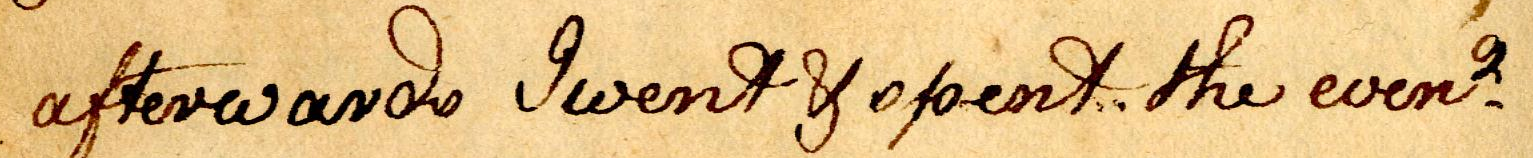afterwards I went & spent the even^g.
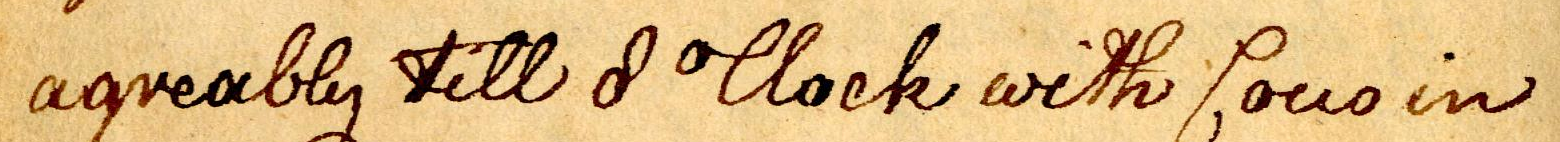agreably till 8 ^oClock with Cousin
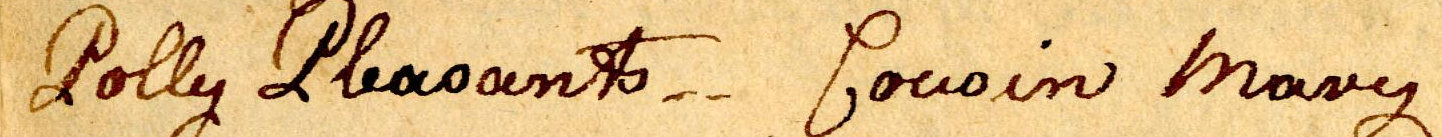Polly Pleasants- Cousin Mary
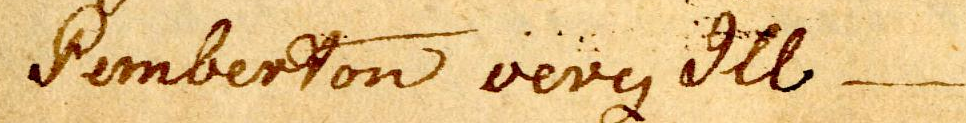Pemberton very Ill -
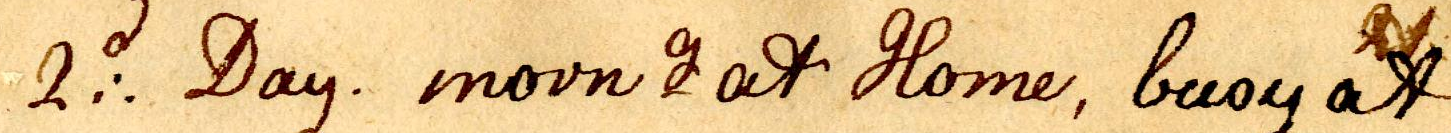2^d Day. morn^g at Home, busy at
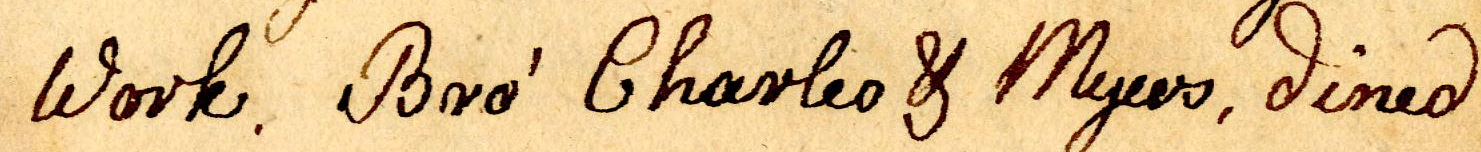Work. Bro' Charles & Myers, dined
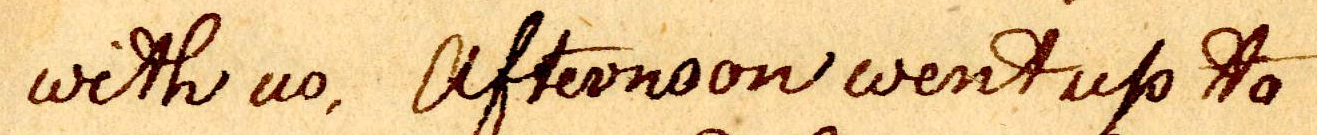with us, Afternoon went up to
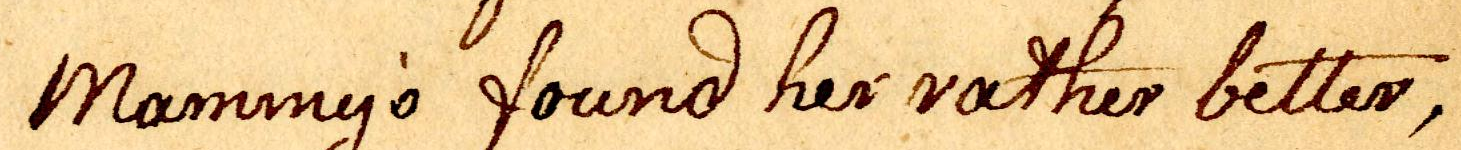Mammy's found her rather better,
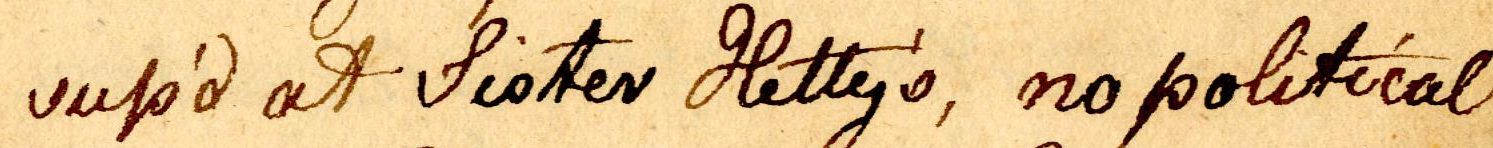sup'd at Sister Hetty's, no political
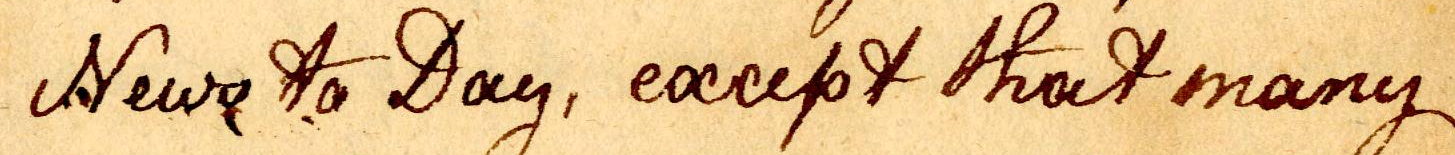News to Day, except that many
